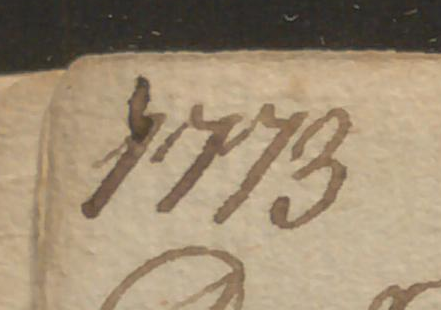1773
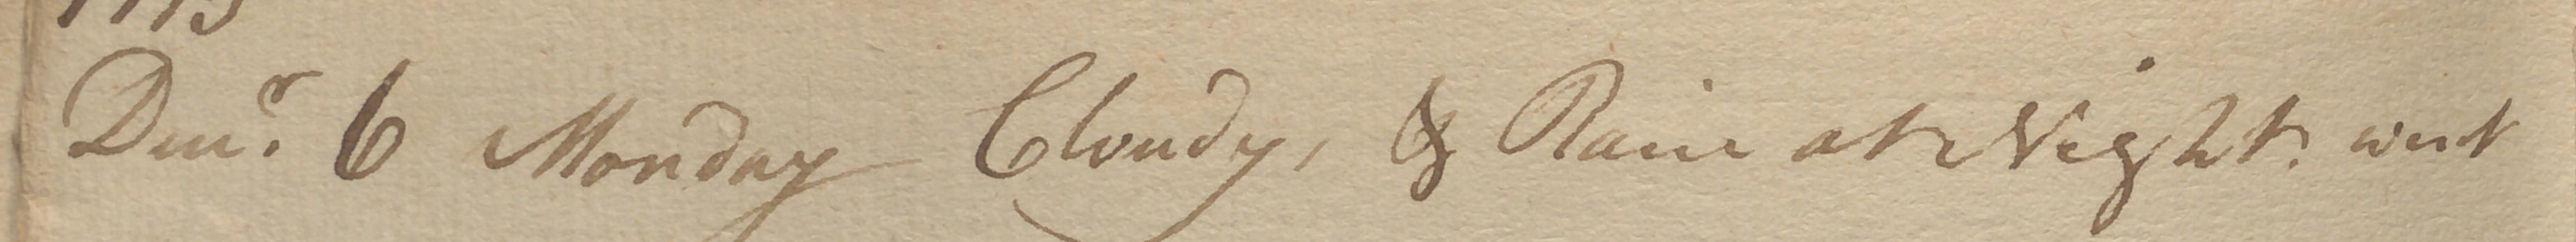Dece^r. 6 Monday Cloudy, & Rain at Night went
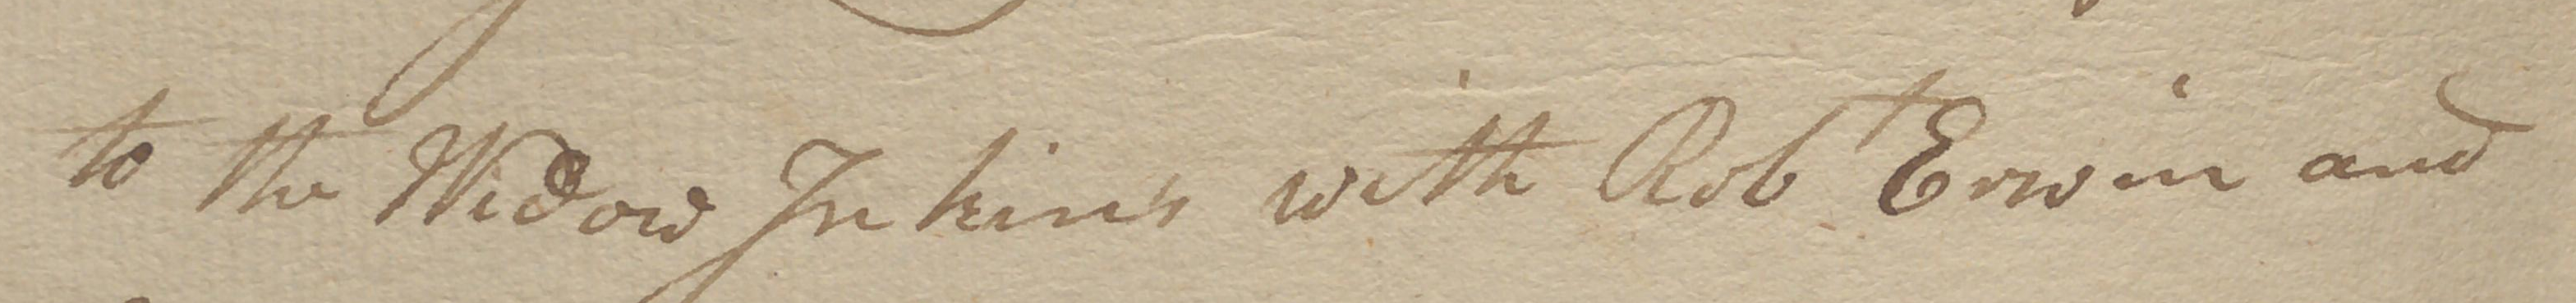to the Widow Inkins with Rob^t. Erwin and
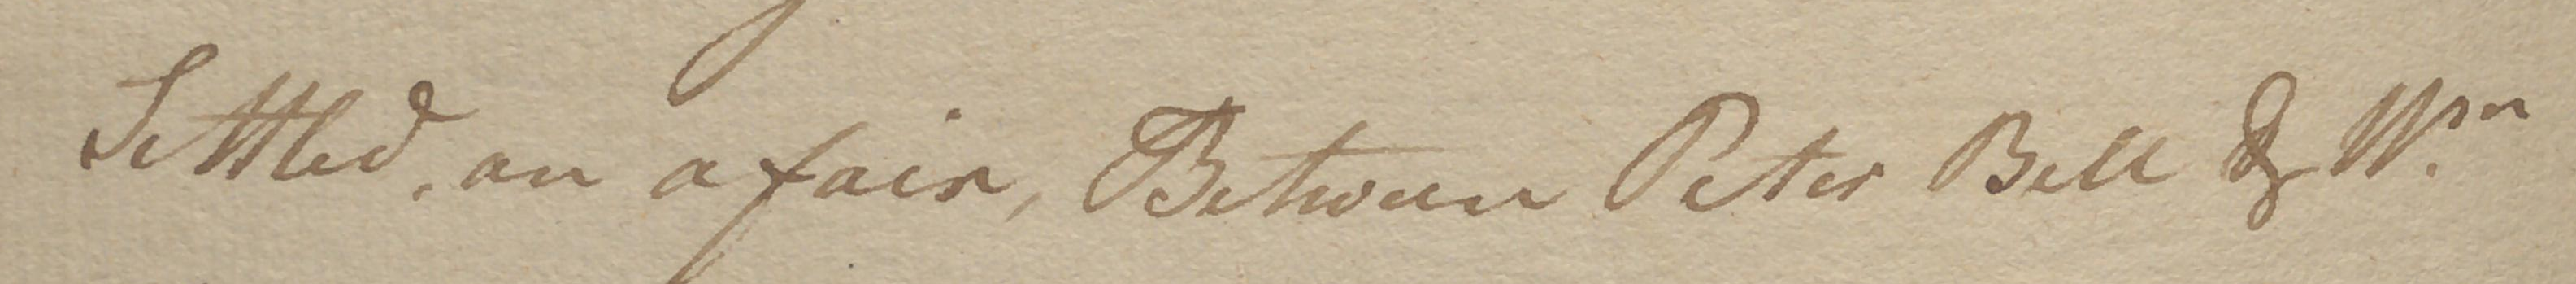settled an afair, Between Peter Bell & W^m.
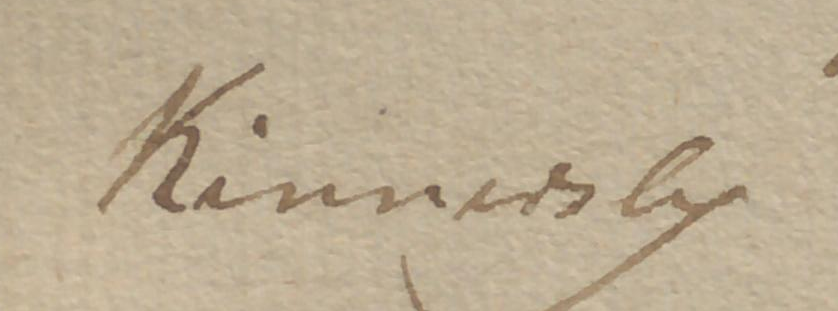Kinnersly
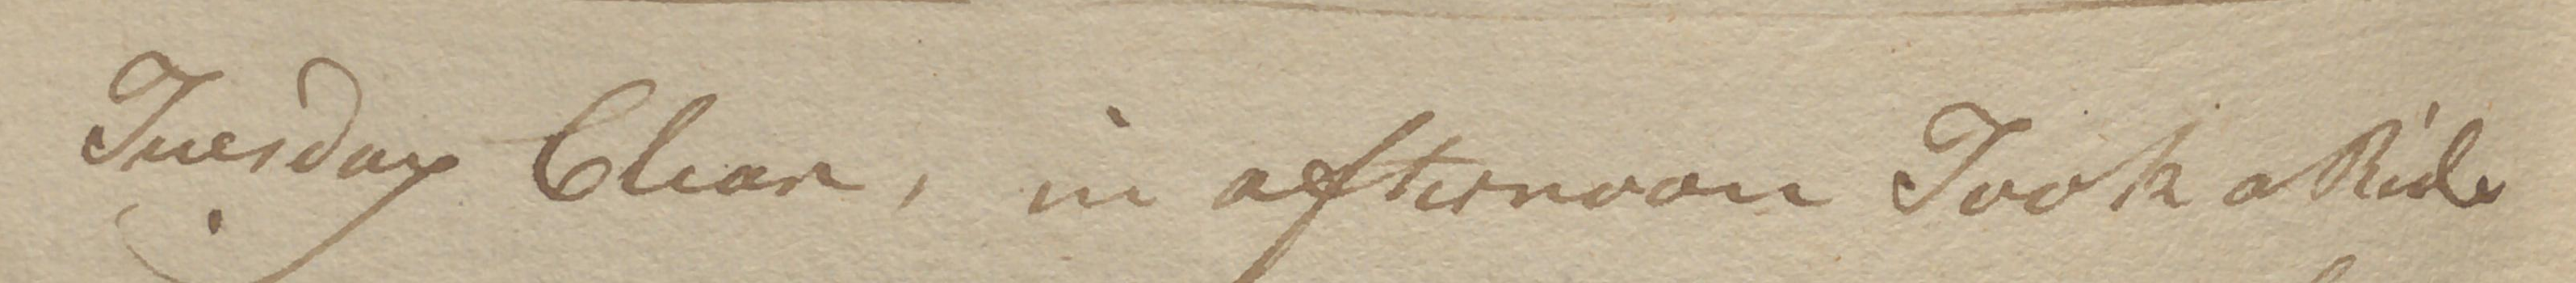Tuesday Clear, in afternoon Took a Ride
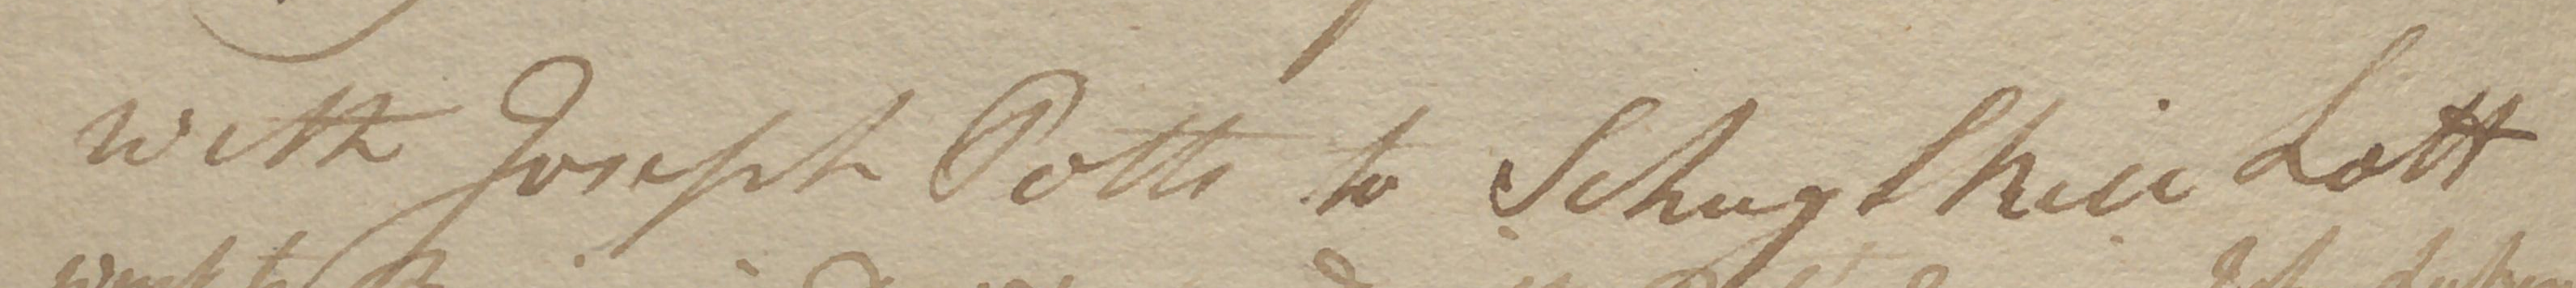with Joseph Potts to Schuylkill Lott
